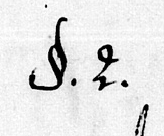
§. 2.
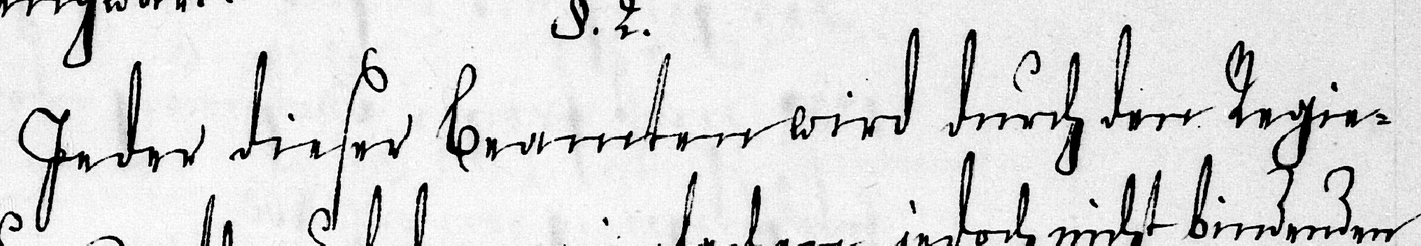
Jeder dieser Beamten wird durch den Regie¬
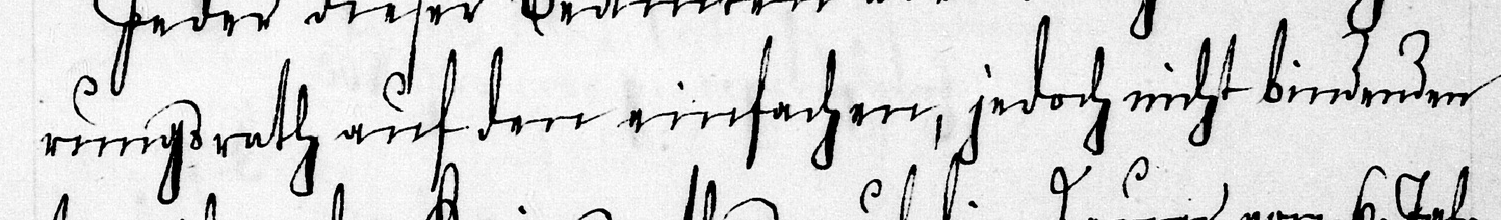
rungsrath auf den einfachen, jedoch nicht bindenden
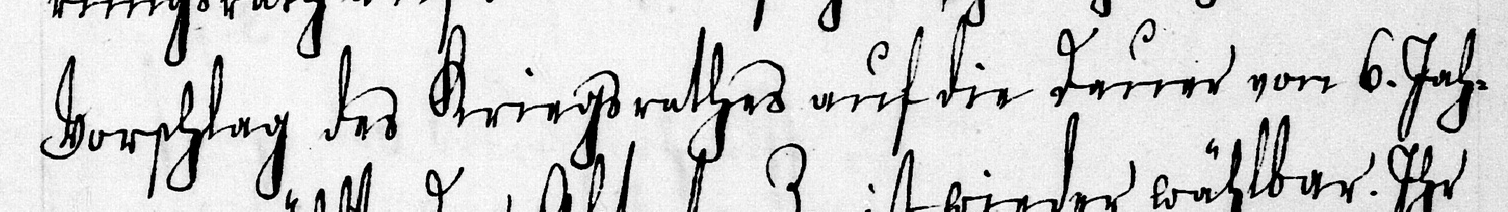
Vorschlag des Kriegsrathes auf die Dauer von 6. Jah¬
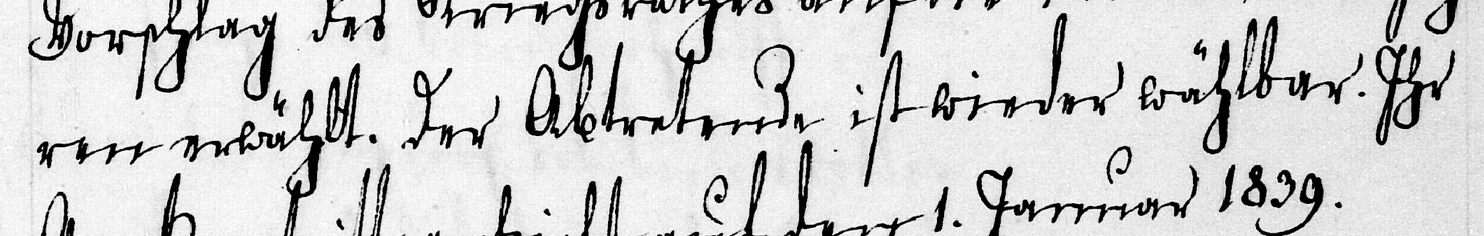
ren erwählt. Der Abtretende ist wieder wählbar. Ihr
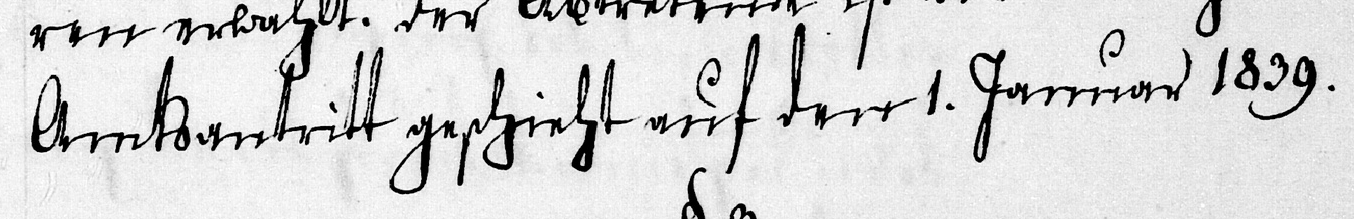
Amtsantritt geschieht auf den 1. Januar 1839.
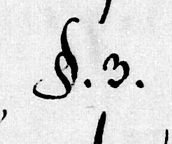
§. 3.
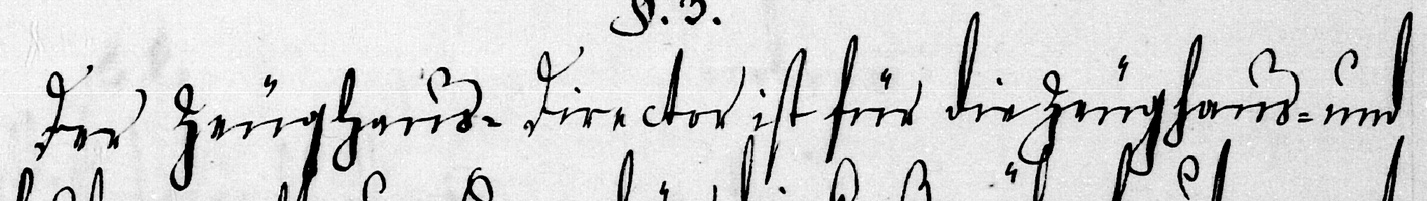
Der Zeughaus-Director ist für die Zeughaus- und
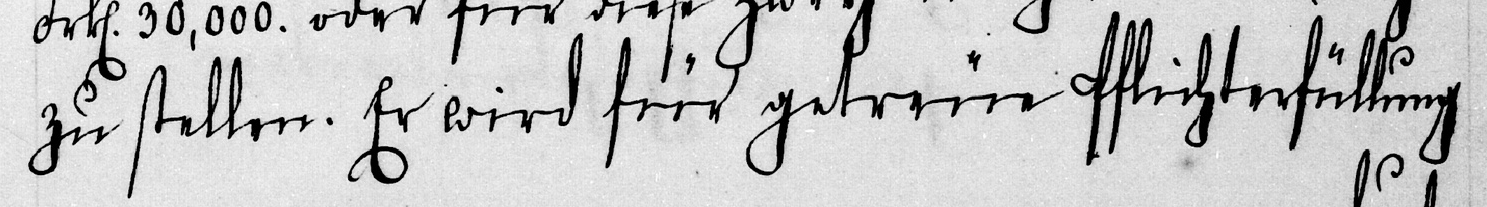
zu stellen. Er wird für getreue Pflichterfüllung
